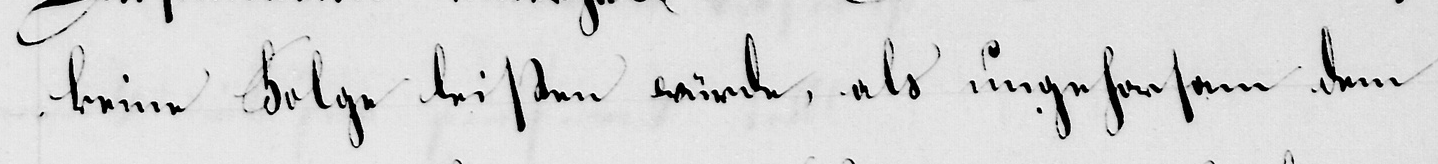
keine Folge leisten würde, als ungehorsam dem
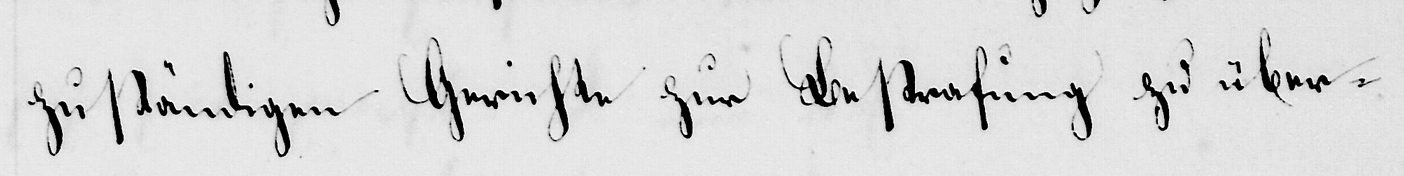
zuständigen Gerichte zur Bestrafung zu über¬
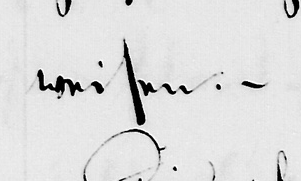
weisen.
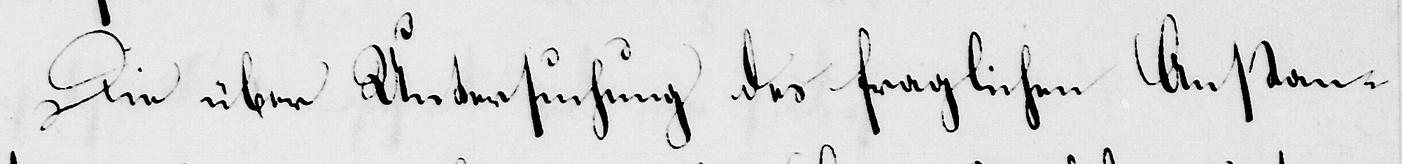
Die über Unterstützung des fraglichen Anstan¬
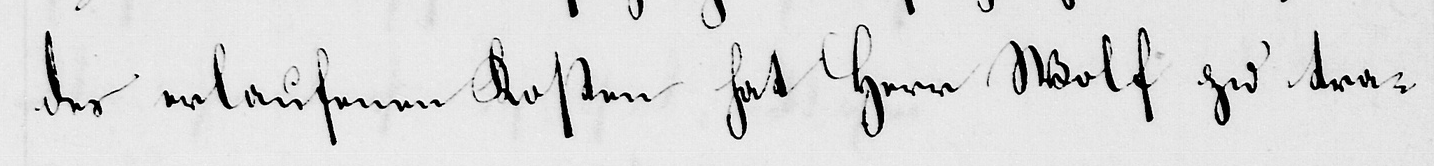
des erlaufenen Kosten hat Herr Wolf zu tra¬
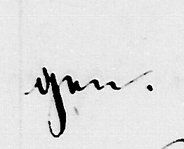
gen.
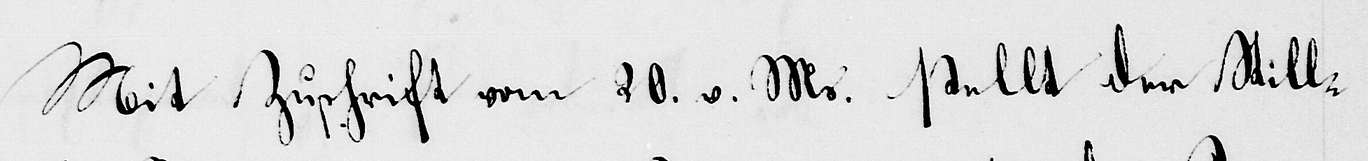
Mit Zuschrift vom 20. v. Ms. stellt der Still¬
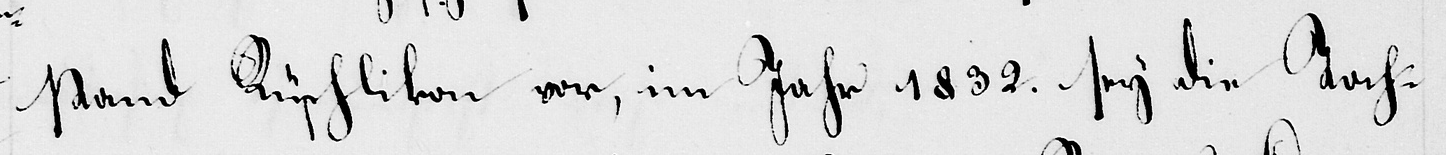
stand Rüschlikon vor, im Jahr 1832. sey die Toch¬
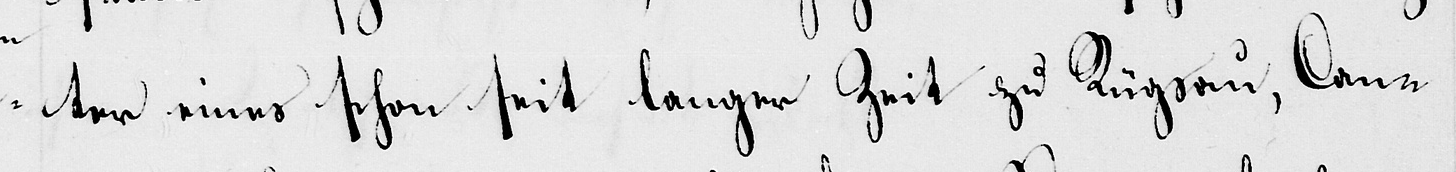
ter eines schon seit langer Zeit zu Rügsau, Can¬
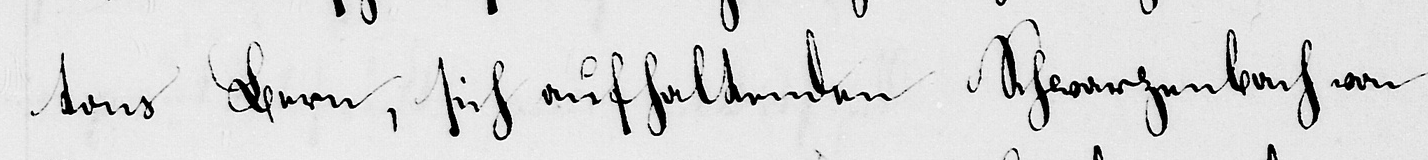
tons Bern, sich aufhaltenden Schwarzenbach von
